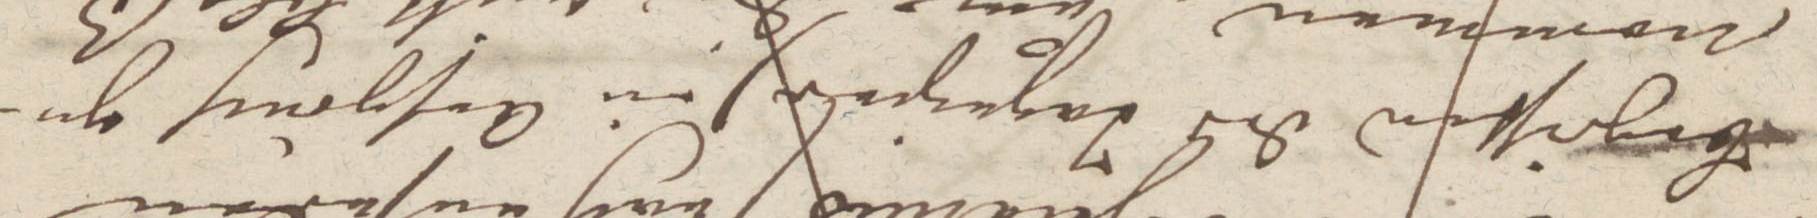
der Werke von Erscheinungen, die der Vorzeit, deren
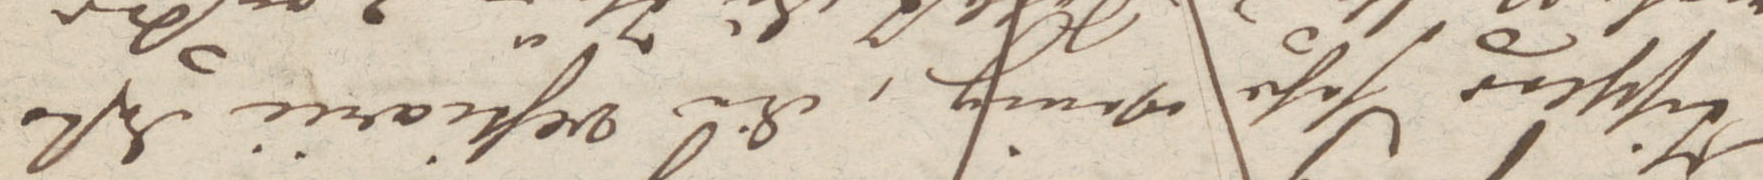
Bei Die Alten schlossen der fhäuslichen
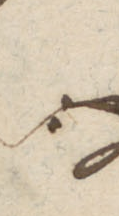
d.h.
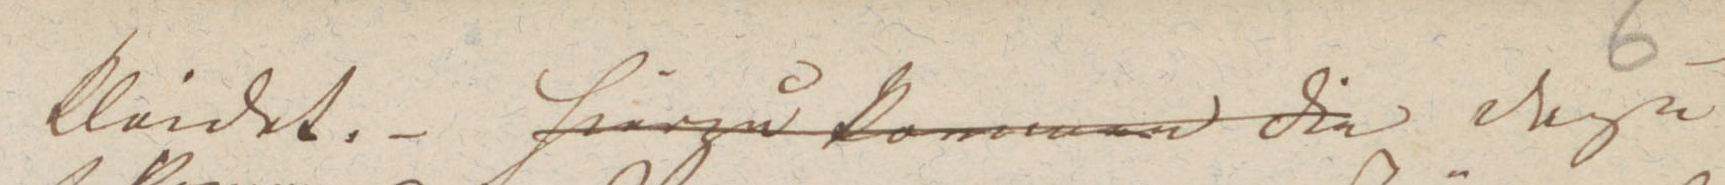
kleidet. – Hierzu kommen die Dazu
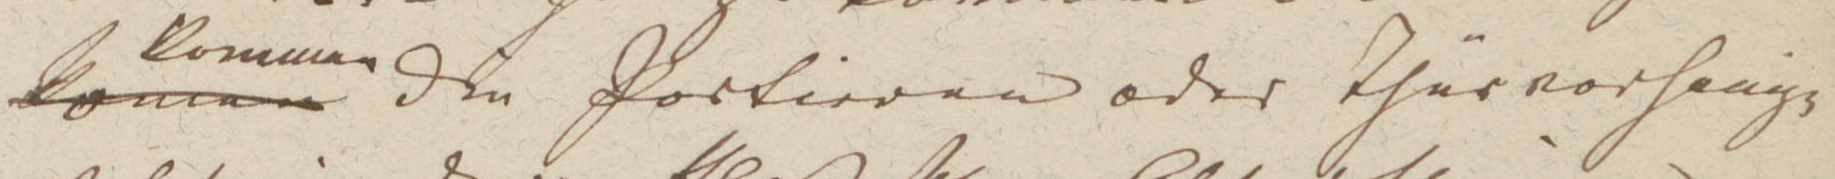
kommen die Portieren oder Thürvorhänge
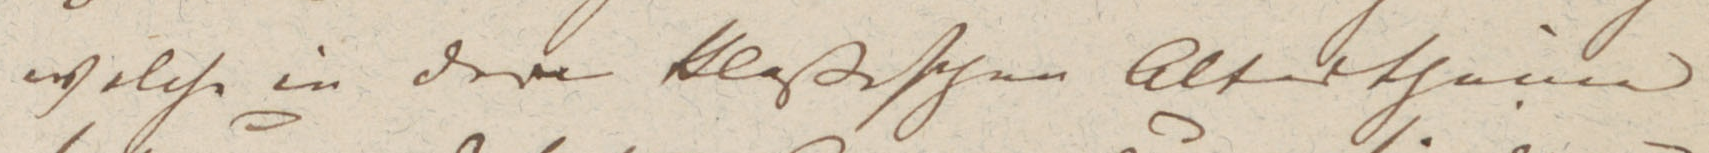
welche in dem klassischen Alterthume
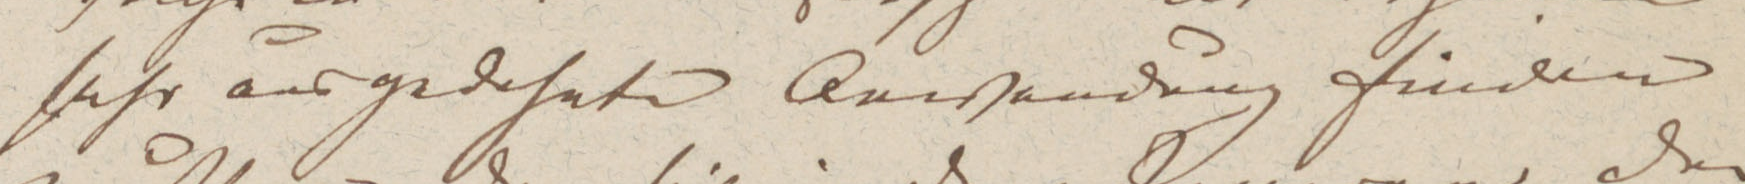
sehr ausgedehnte Anwendung finden
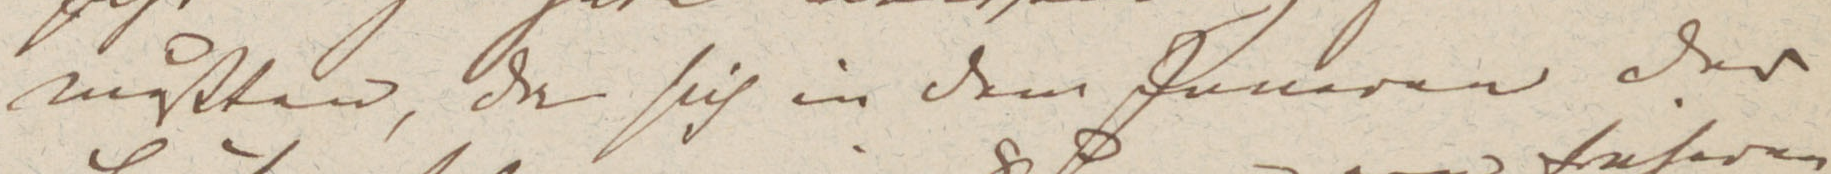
mussten, da sich in dem Inneren der
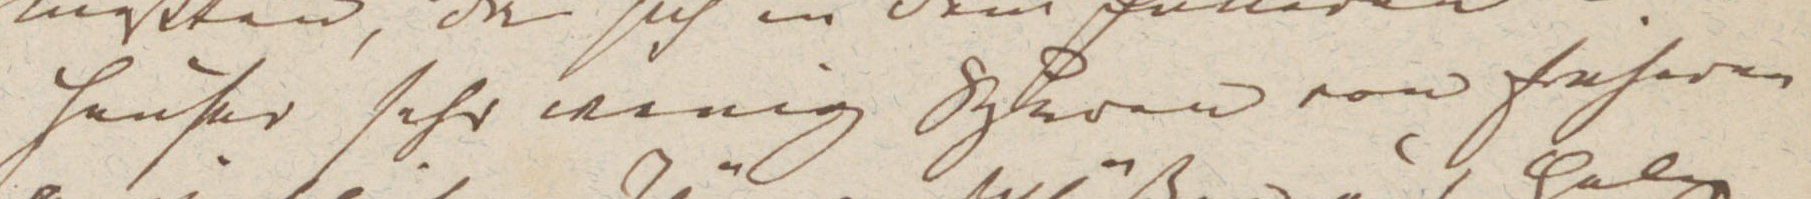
Hauser sehr wenig Spuren von früheren
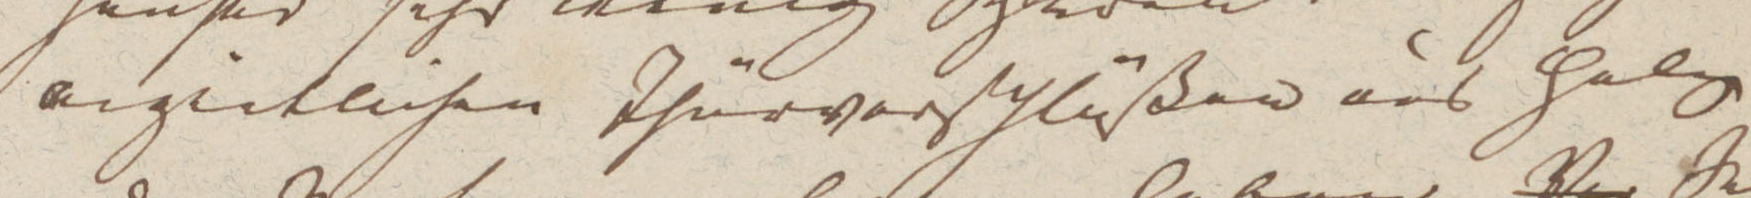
eigentlichen Thürverschlüssen aus Holz
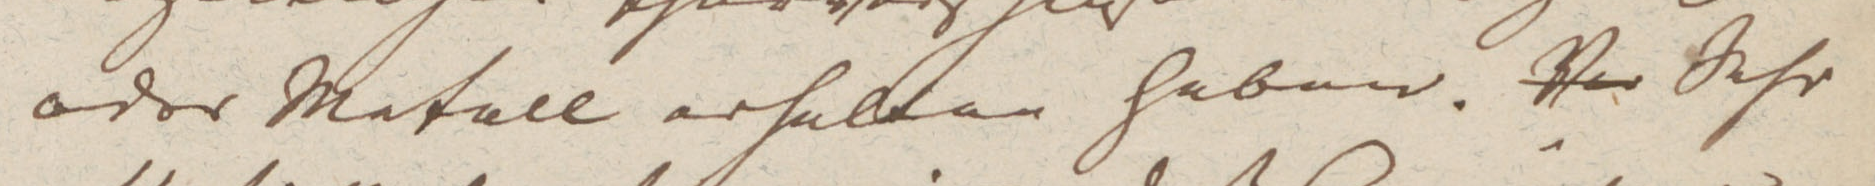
oder Metall erhalten haben. Ver Sehr
